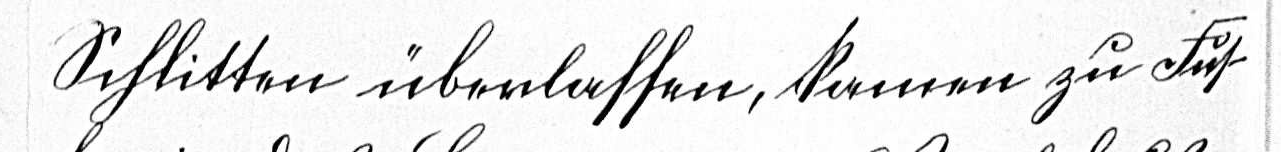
Schlitten überlassen, kamen zu Fu¬
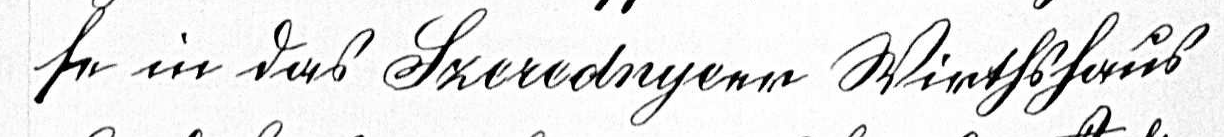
se in das Szerednyer Wirthshaus
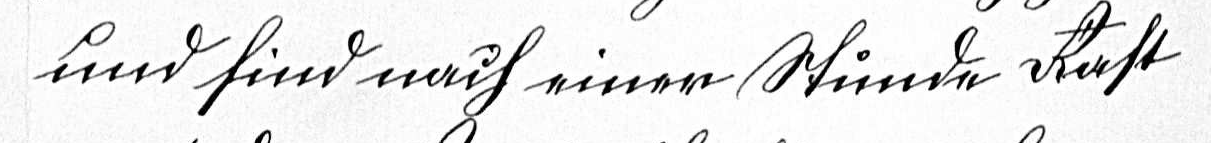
und sind nach einer Stunde Rast
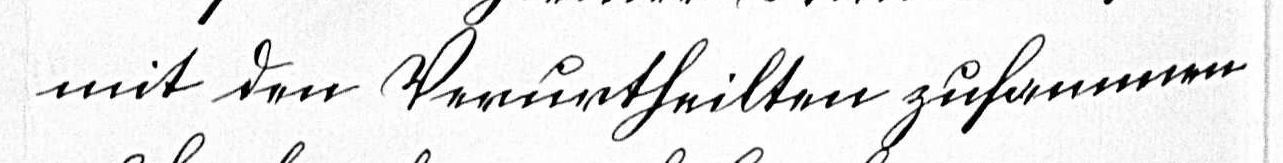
mit den Verurtheilten zusammen
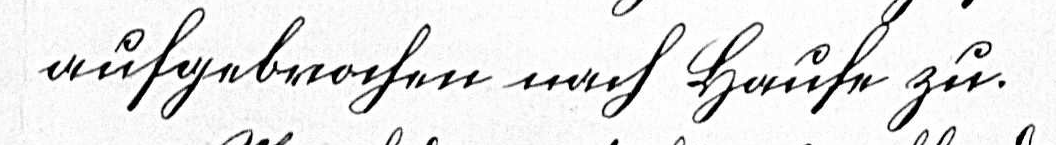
aufgebrochen nach Hause zu.
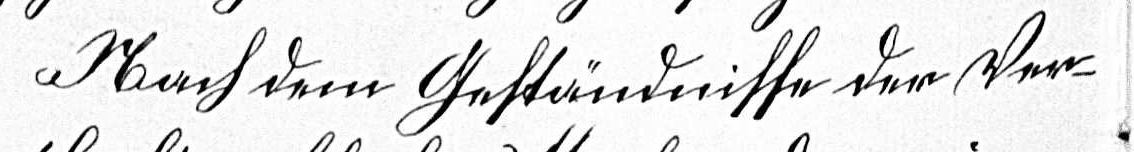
Nach dem Geständnisse der Ver¬
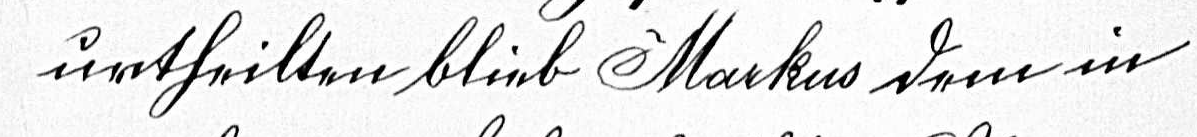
urtheilten blieb Markus dem in
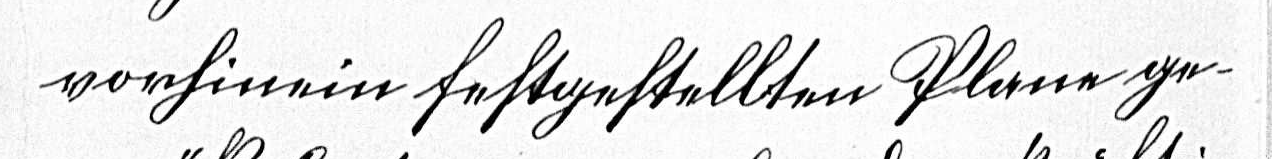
vorhinein festgestellten Plane ge¬
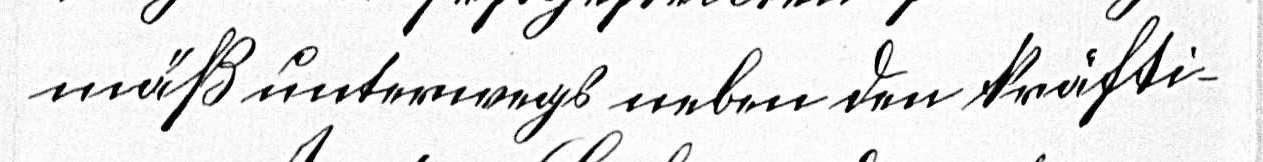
mäß unterwegs neben den kräfti¬
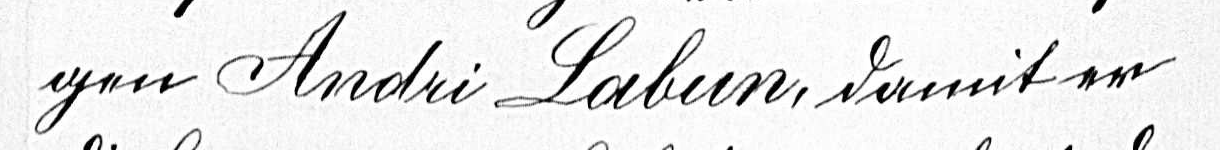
gen Andri Labun, damit er
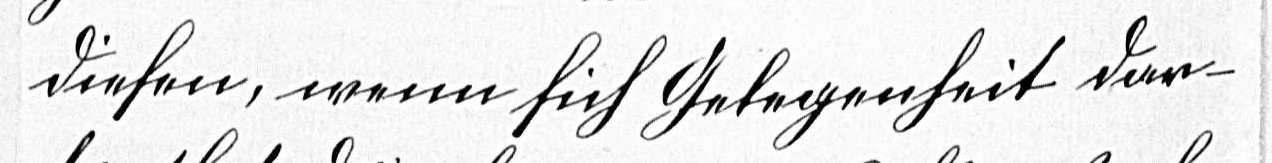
diesen, wenn sich Gelegenheit dar¬
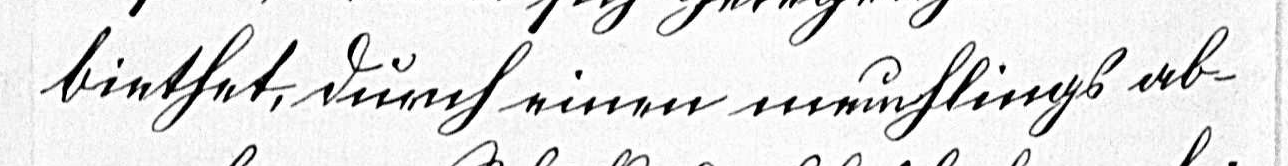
biethet, durch einen meuchlings ab¬
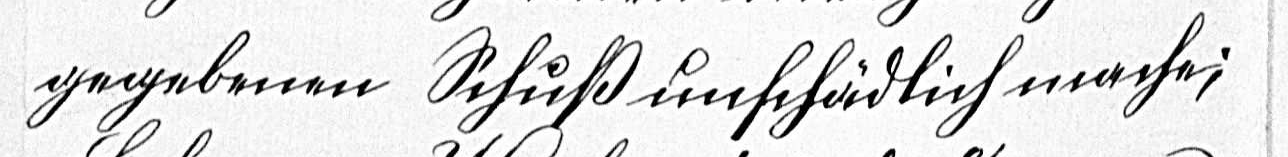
gegebenen Schuß unschädlich mache;
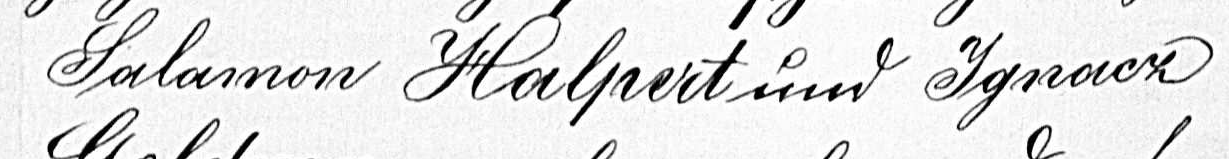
Salamon Halpert und Jgnacz
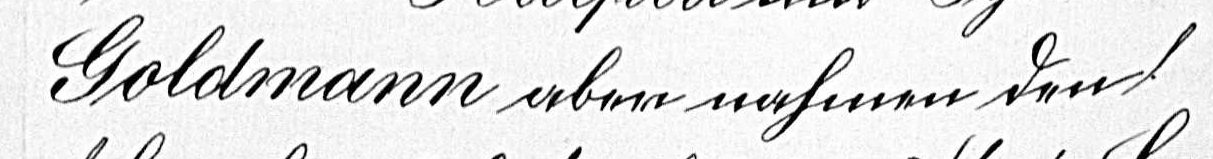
Goldmann aber nahmen den
